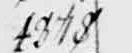4378
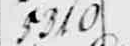5310
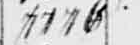7776
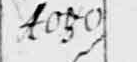4050
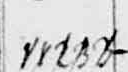11233
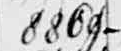8869
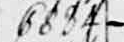6834
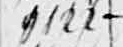9122
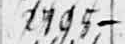2795
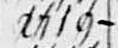2719
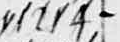1214
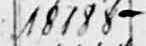18188
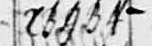23934
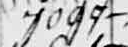7099
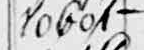10601
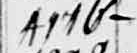4176
